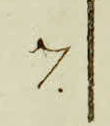7.
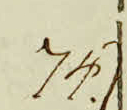74.
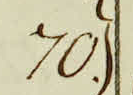70.
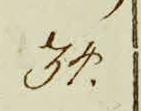34.
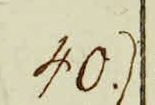40.
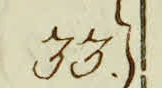33.
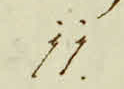11.
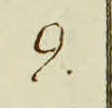9.
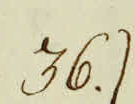36.
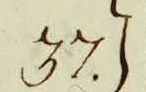37.
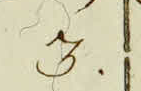3.
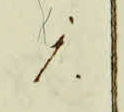1.
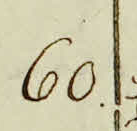60.
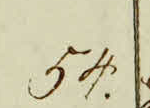54.
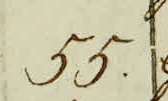55.
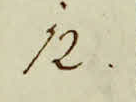12.
